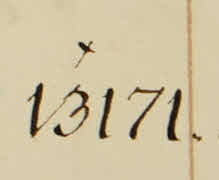13171
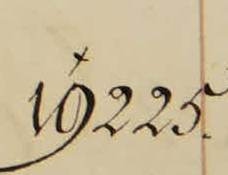19225
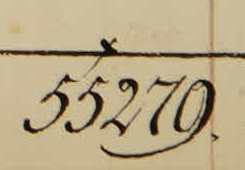55279.
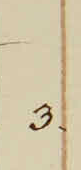3
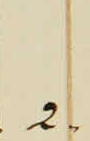2
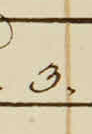3
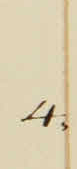4
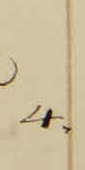4
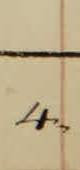4
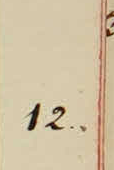12.
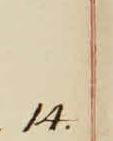14.
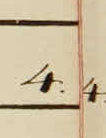4.
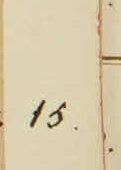15.
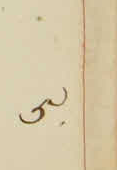5.
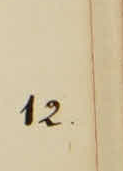12.
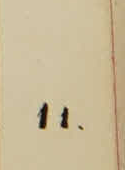11.
